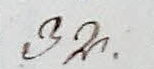32.
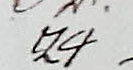24.
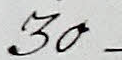30
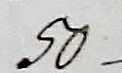50
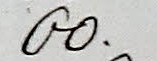60.
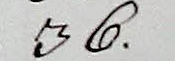36.
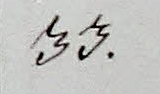33.
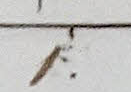1.
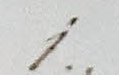1.
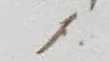1
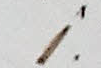1
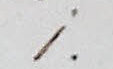1.
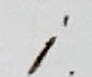1
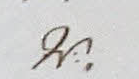2.
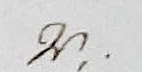2.
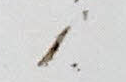1.
